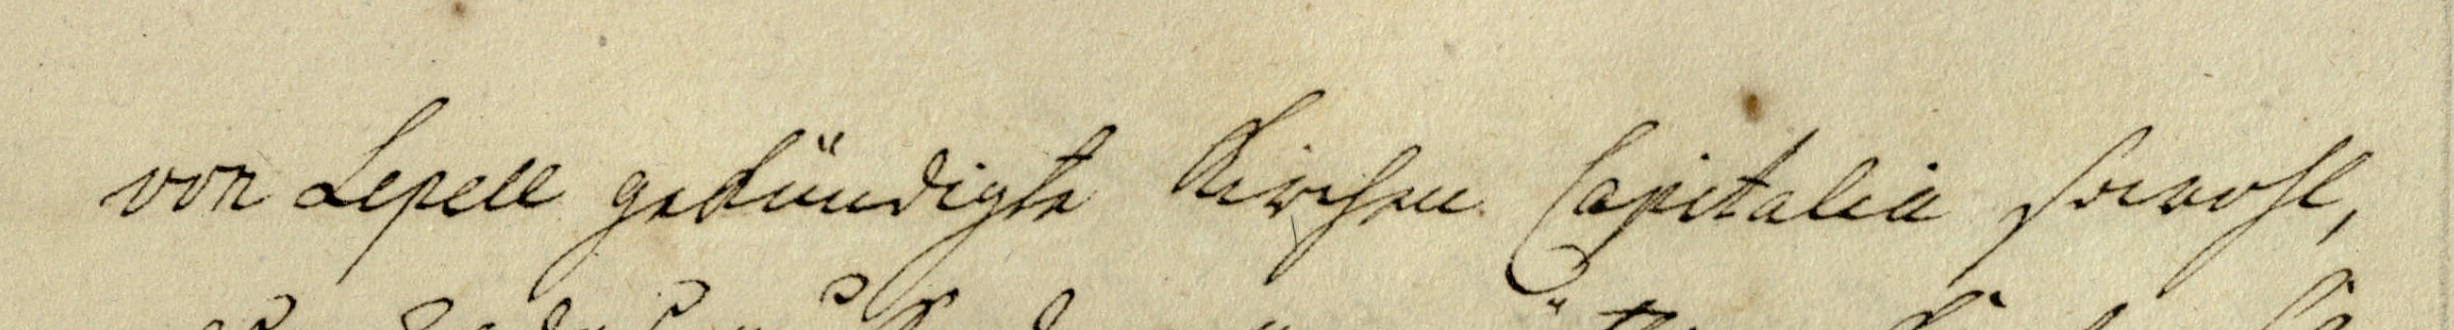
von Lepell gekündigte Kirchen Capitalia sowohl,
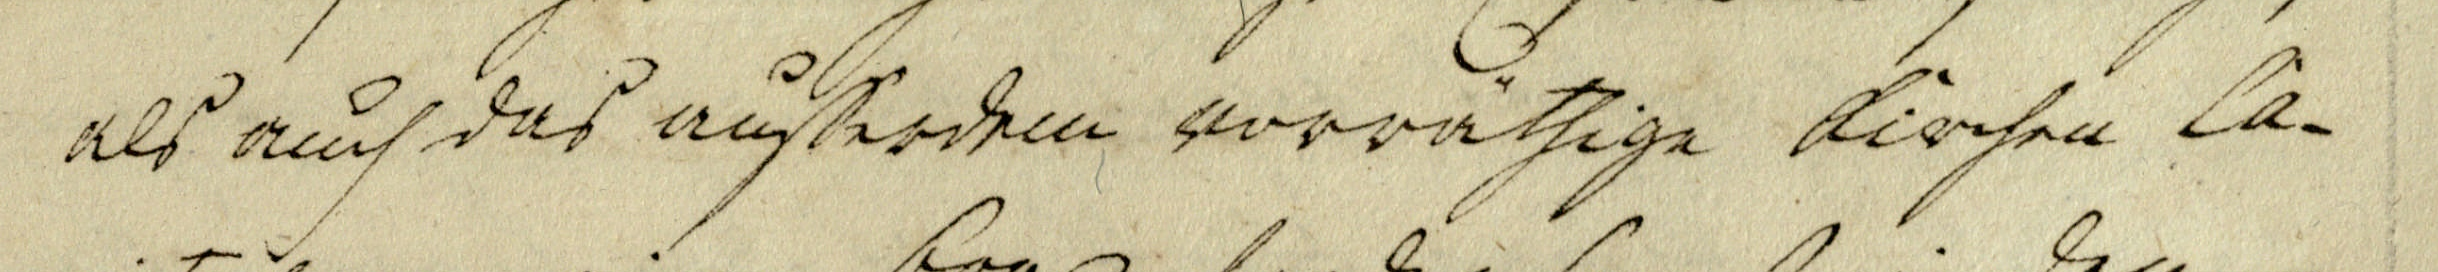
als auch das ausserdem vorräthige Kirchen Ca¬
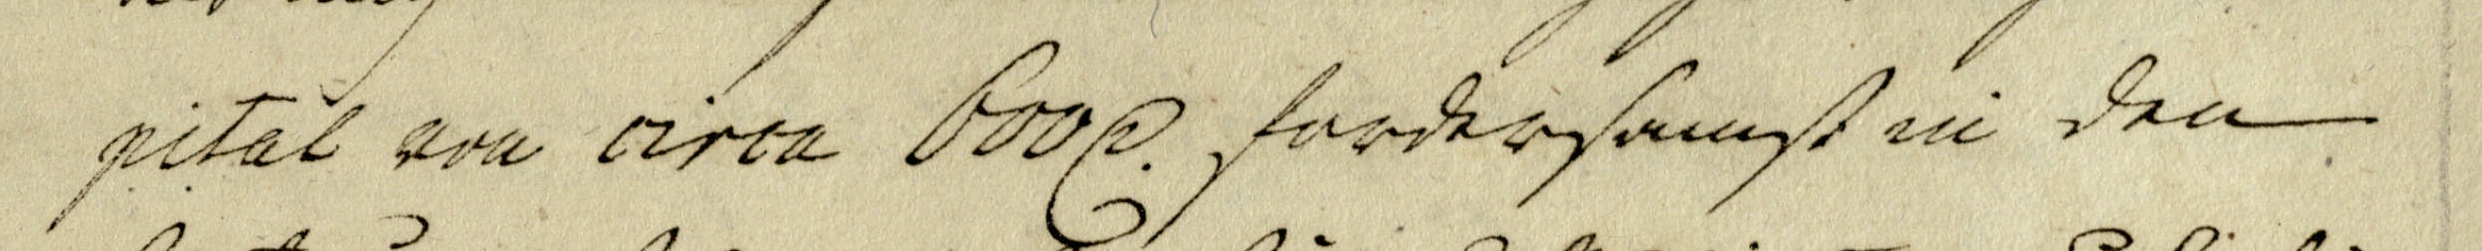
pital von circa 600 l. fordersamst in den
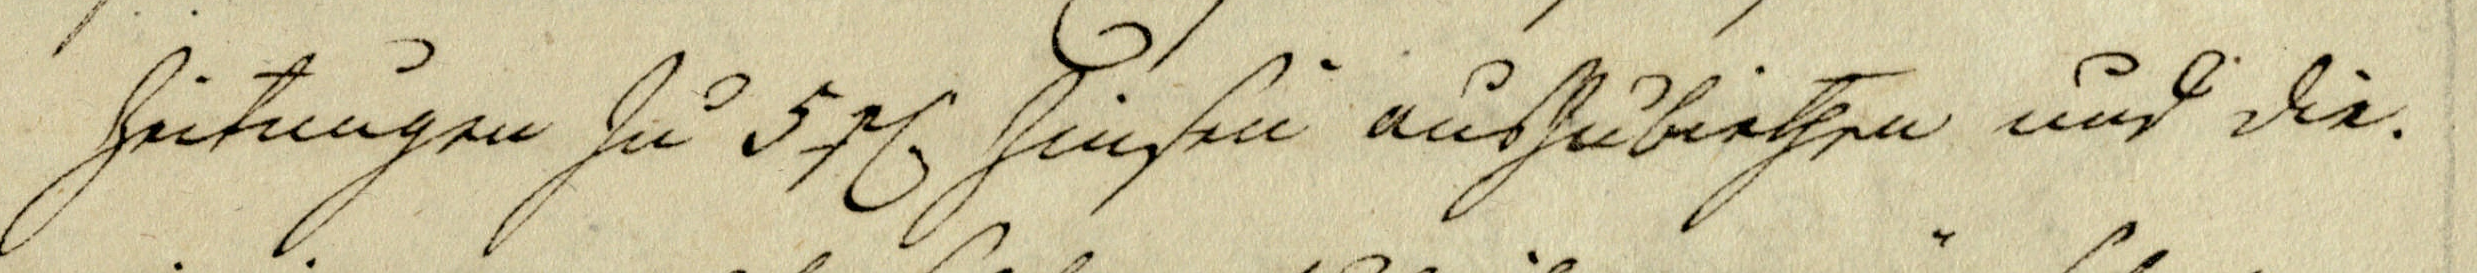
Zeitungen zu 5 pl. Zinsen auszubiethen und die¬
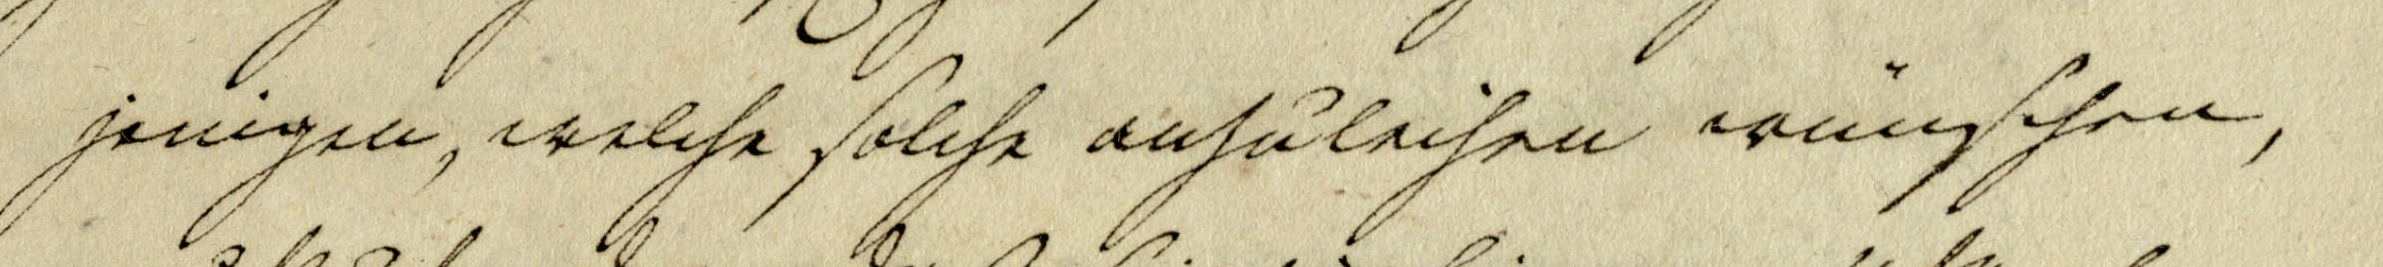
jenigen, welche solche anzuleihen wünschen,
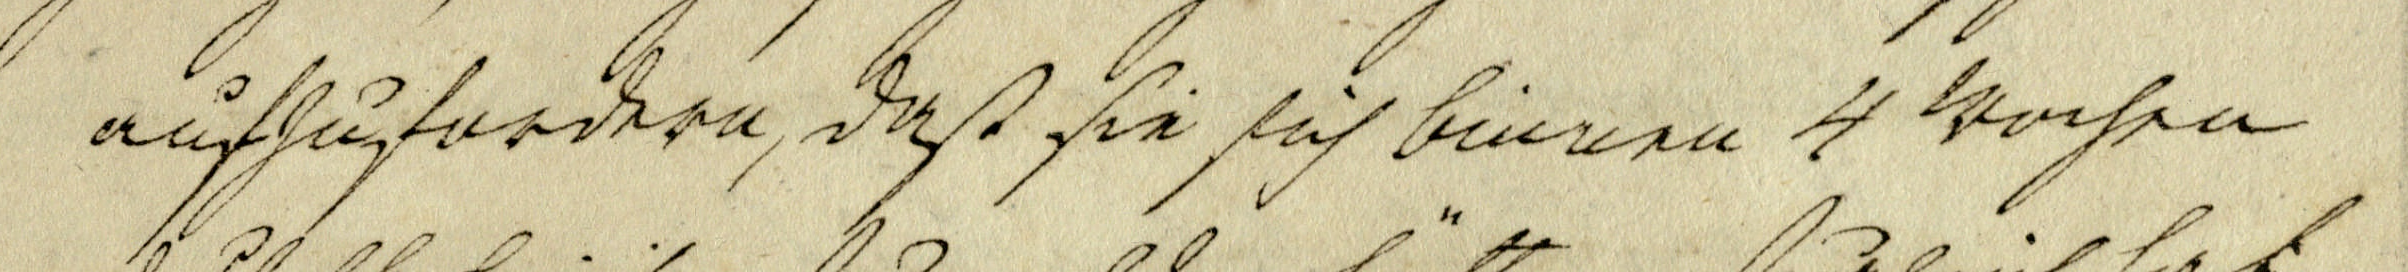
aufzufordern, daß sie sich binnen 4 Wochen
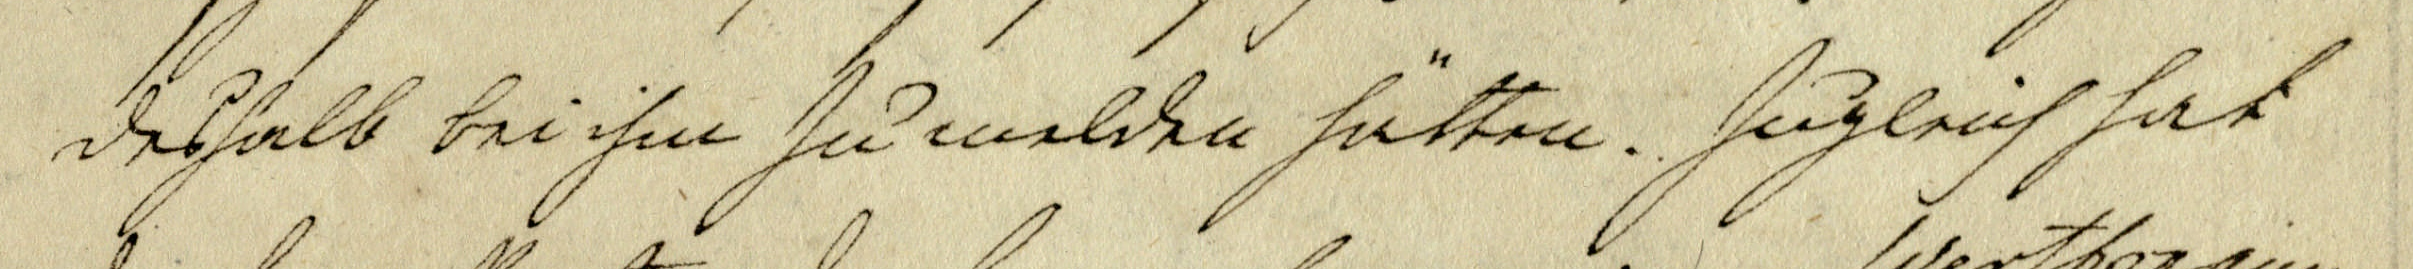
deshalb bei ihm zu melden hätten. Zugleich hat
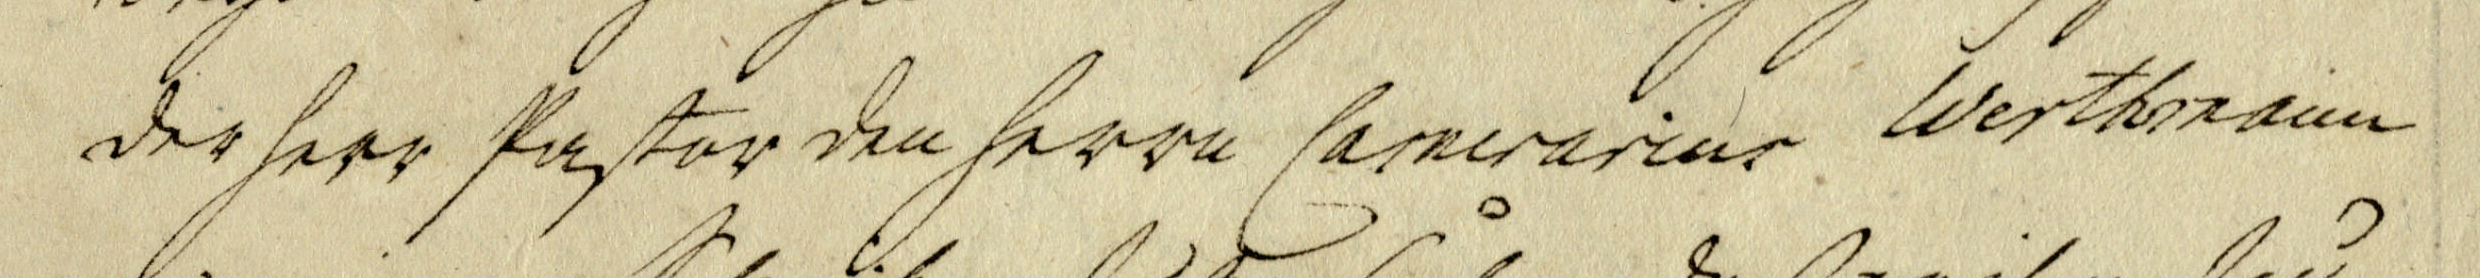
der Herr Pastor den Herrn Camerarius Werthmann
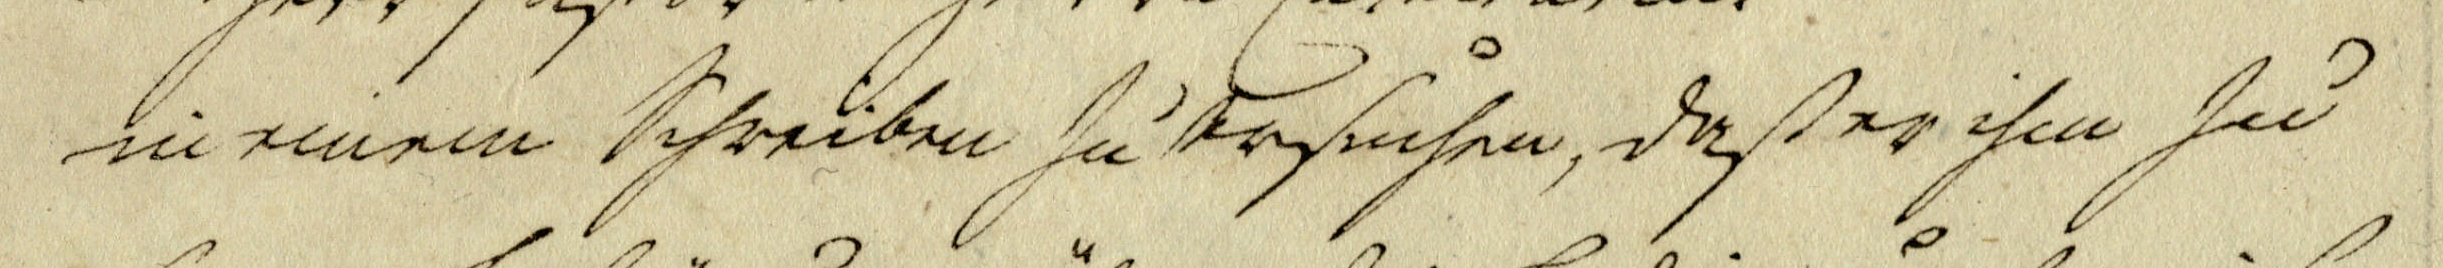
in einem Schreiben zu ersuchen, daß er ihm zu
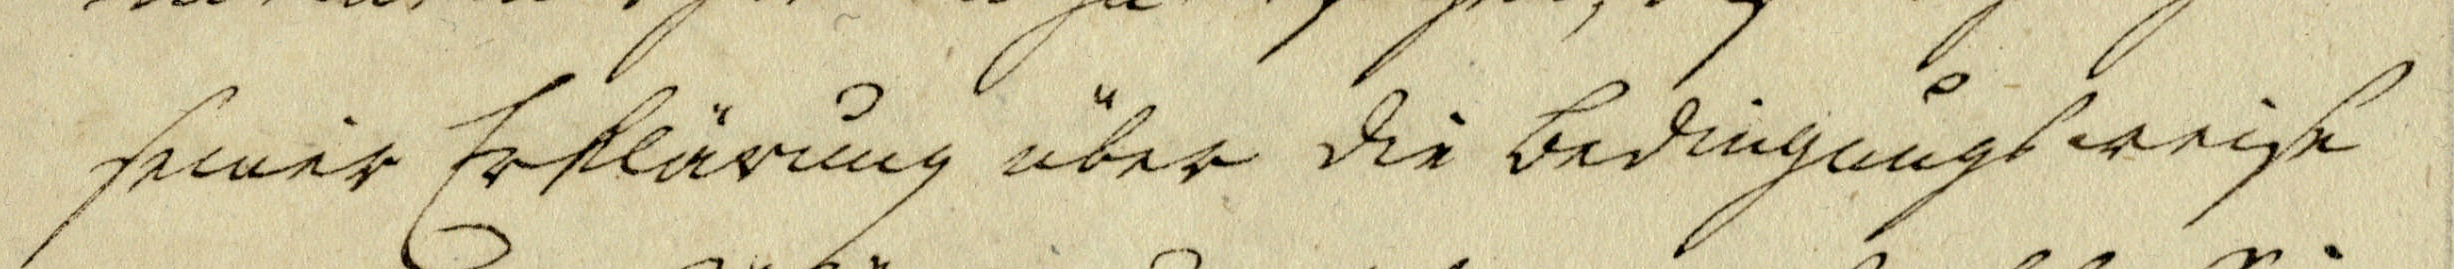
seiner Erklärung über die Bedingungsweise
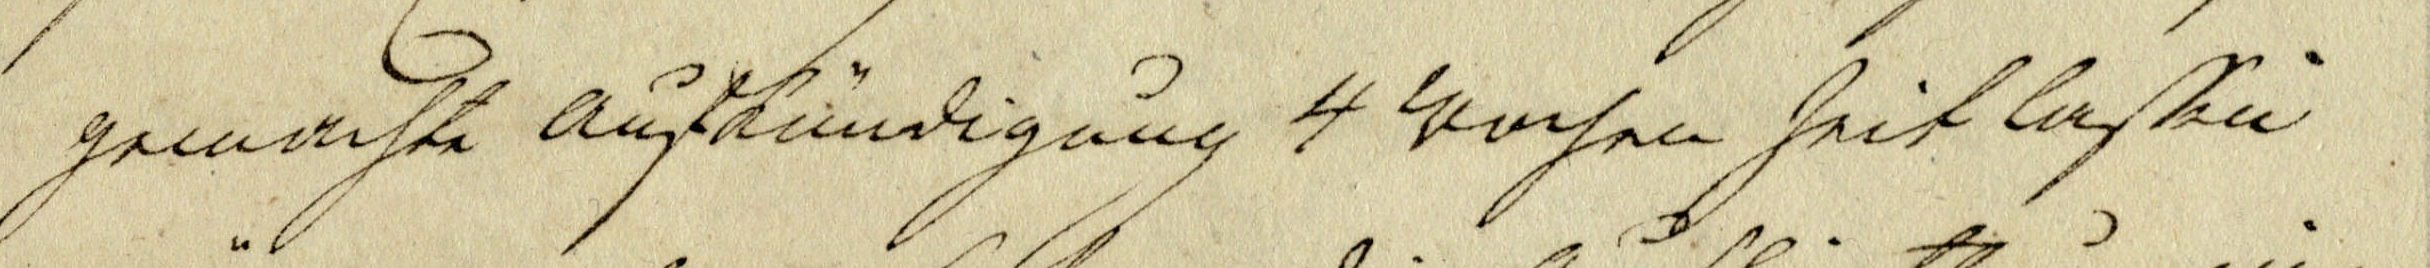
gemachte Aufkündigung 4 Wochen Zeit lassen
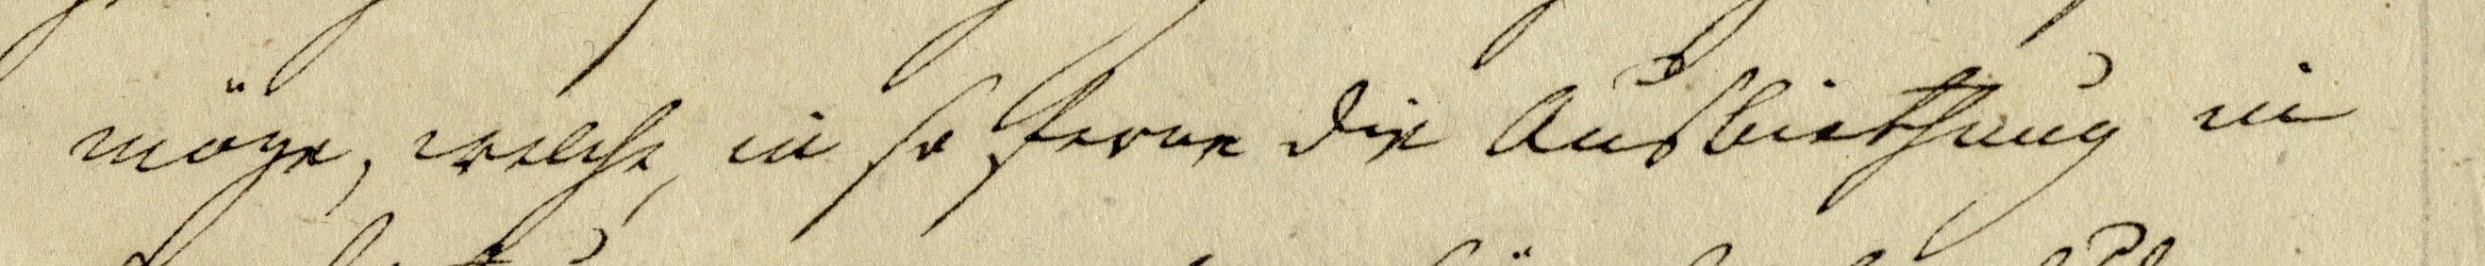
möge, welche in so ferne die Ausbiethung in
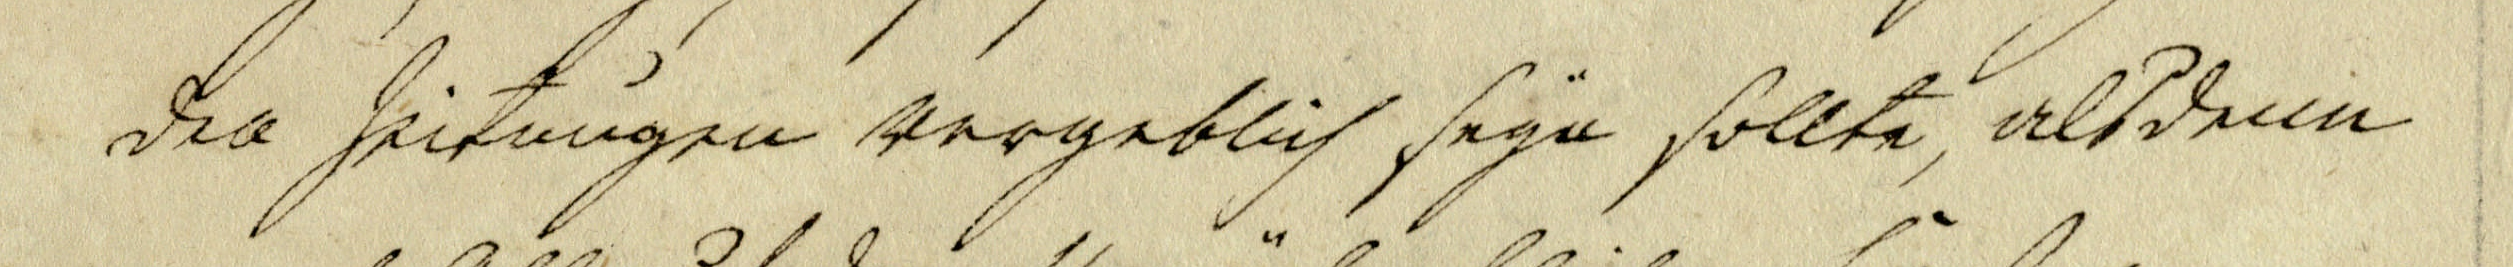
den Zeitungen vergeblich seÿn sollte, alsdenn
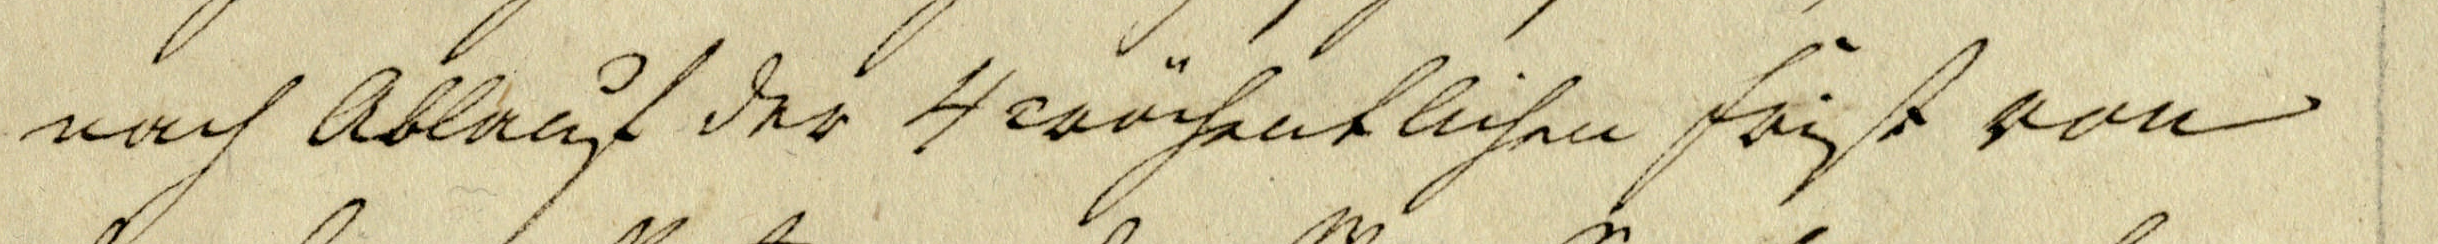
nach Ablauf der 4 wöchentlichen Frist von
